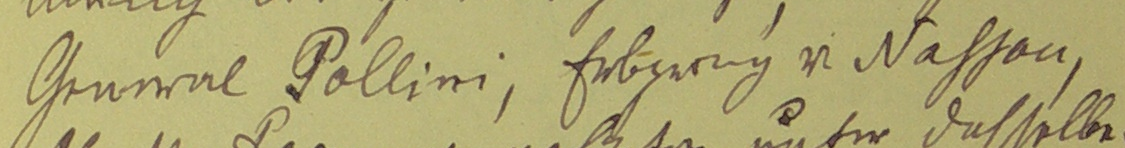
General Pollini, Erbprinz von Nastan,
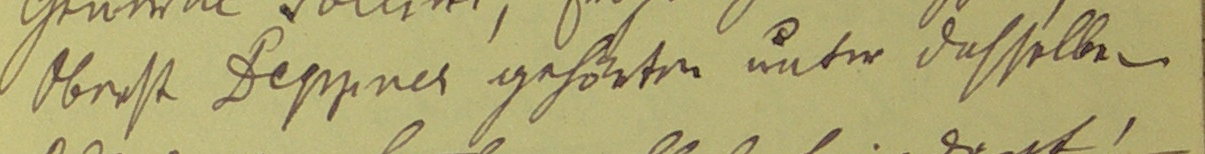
Oberst Deppner gehörten unter dieselben.
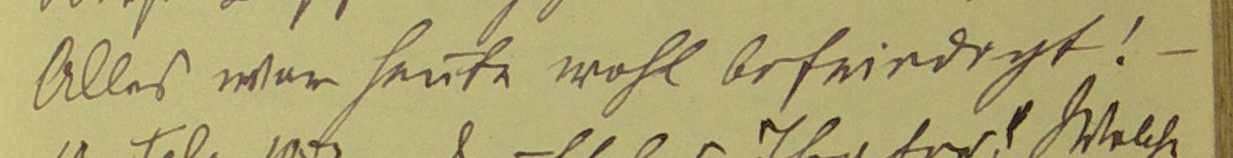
Alles war heute wohl befriedigt!-
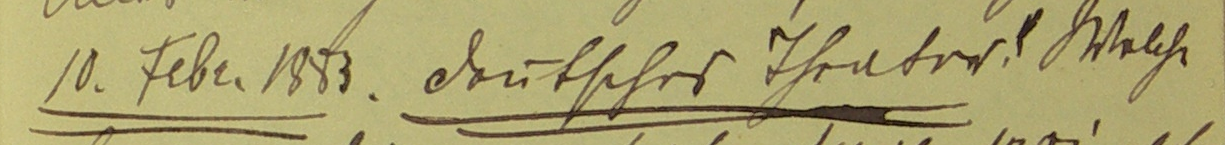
10. Febr. 1883. Deutsches Theater !. Welche
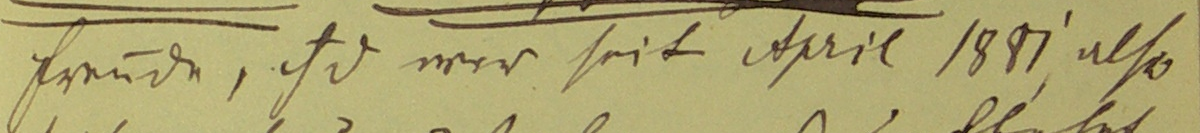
Freude, auf die wir seit April 1881, also
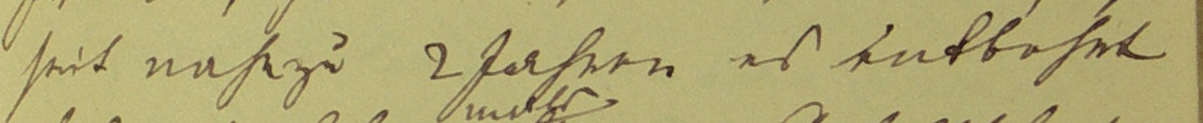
seit nahezu 2 Jahren es entbehr
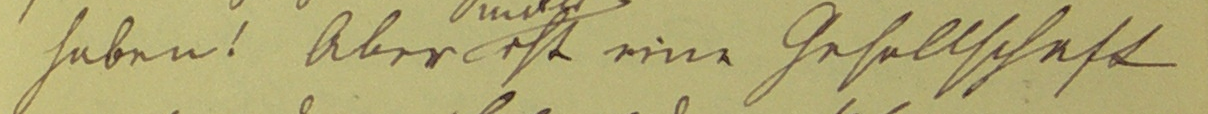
haben,! Abermals ist eine Gesellschaft
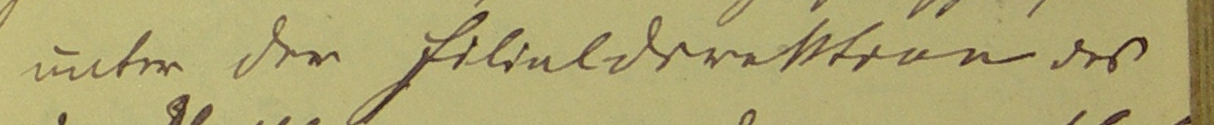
unter der Filialdirektion des
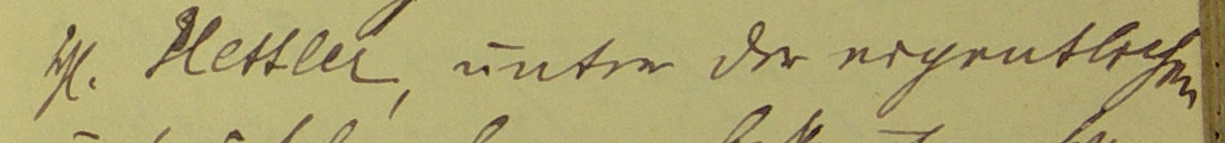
H. Hettler, unter der eigentlichen
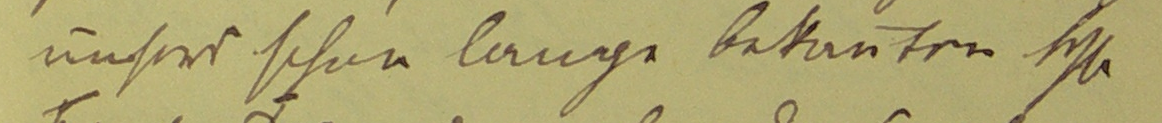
unsers schon lange bekannten H.
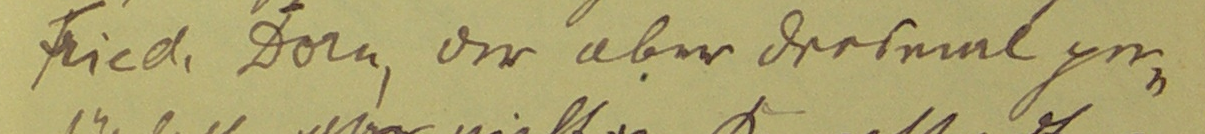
Fried. Dorn, der aber diesmal per¬
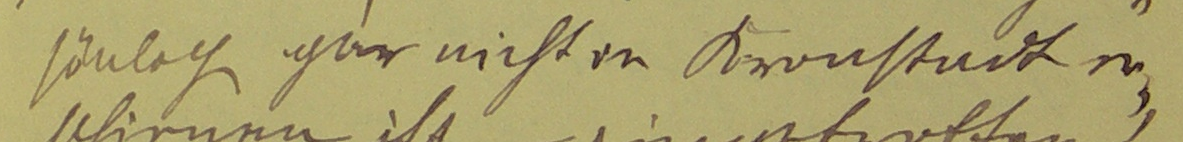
sönlich gar nicht in Kronstadt er¬
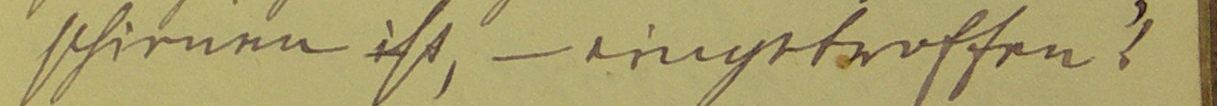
schienen ist,.-eingetroffen.
